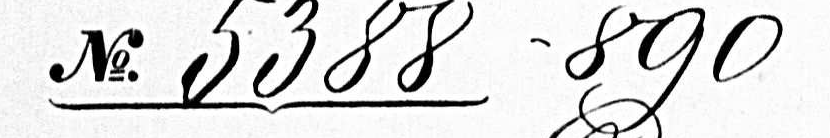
No. 5388 - 890
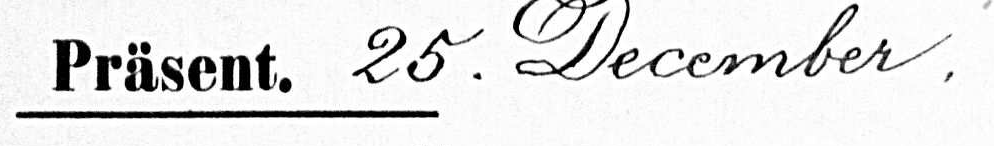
Präsent. 25. December.
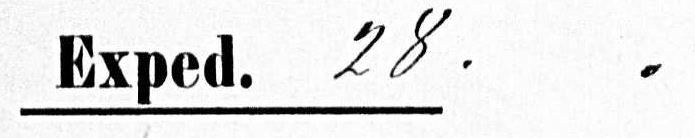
Exped. 28. December.
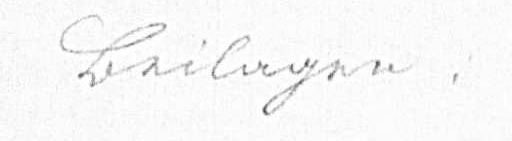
Beilagen.
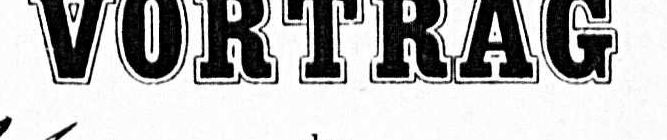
Vortrag
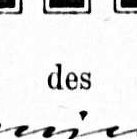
des
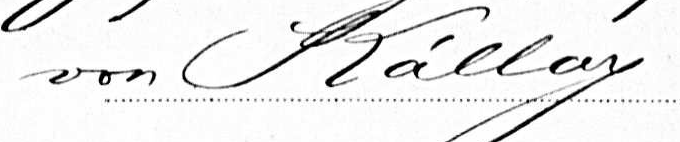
von Kállay
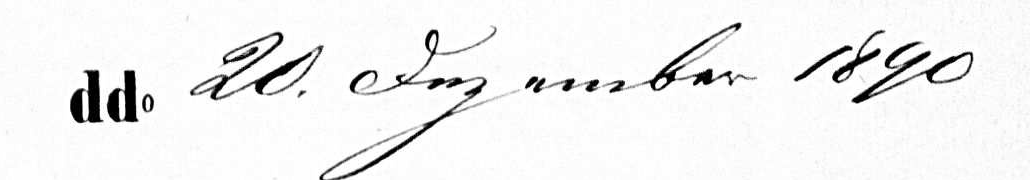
ddo 20. Dezember 1890
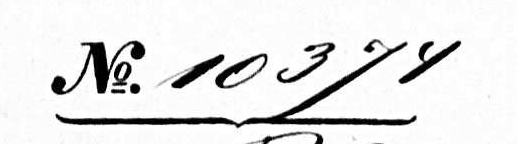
No. 10374
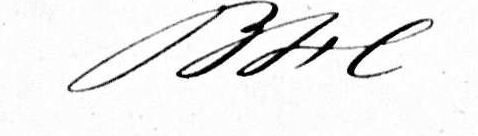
BH
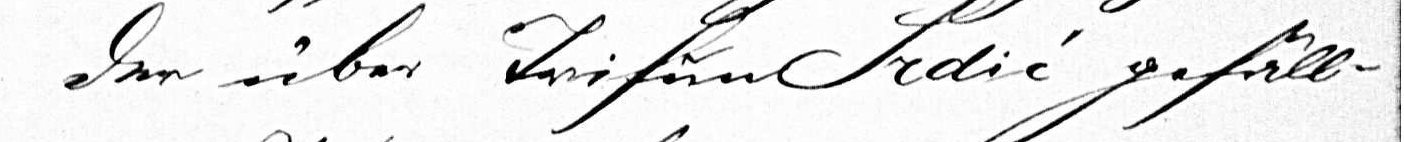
der über Trifun Srdić gefäll¬
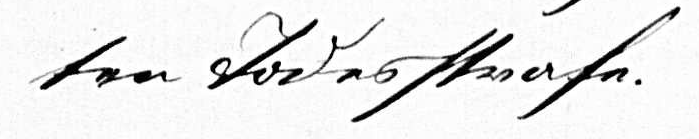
ten Todesstrafe.
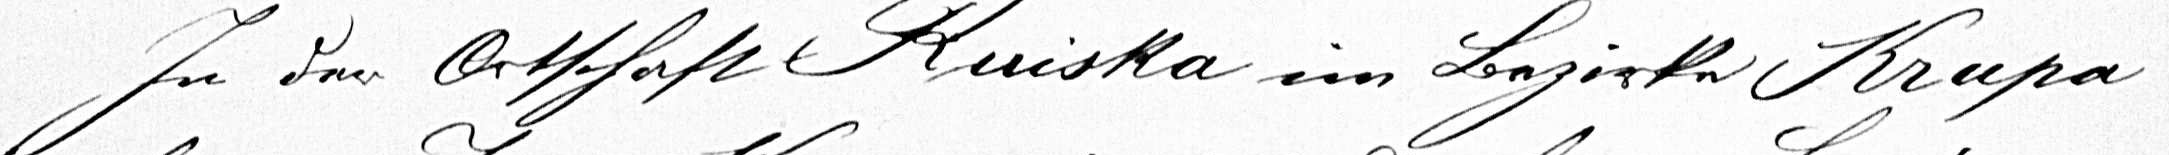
Jn der Ortschaft Ruiska im Bezirke Krupa
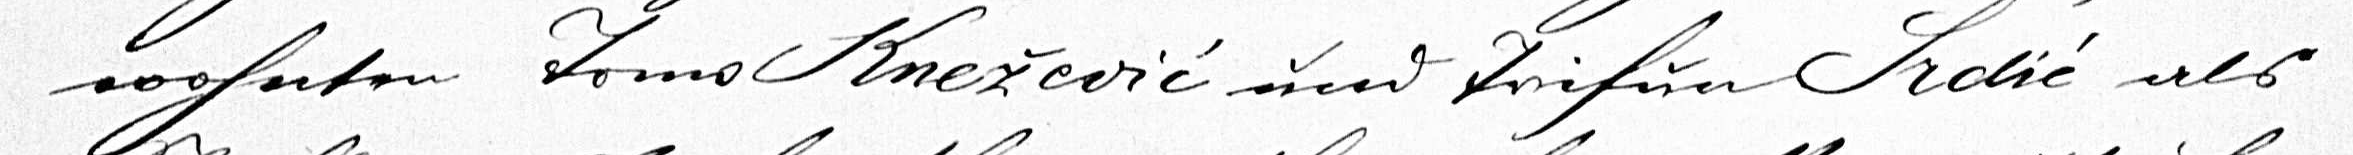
wohnten Tomo Knežević und Treifun Srdić als
